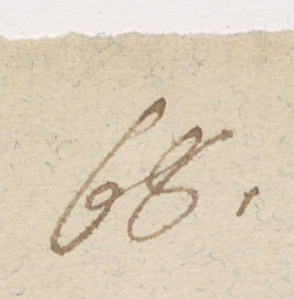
68.
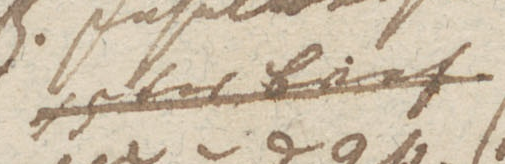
darf aus hier noch
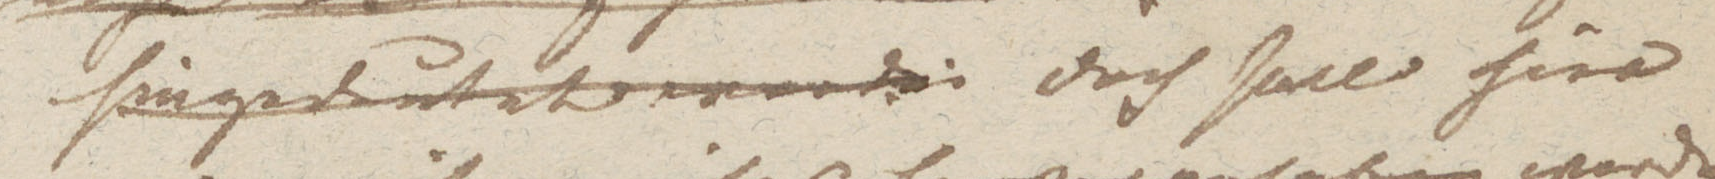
hingedeutet werden doch soll hier
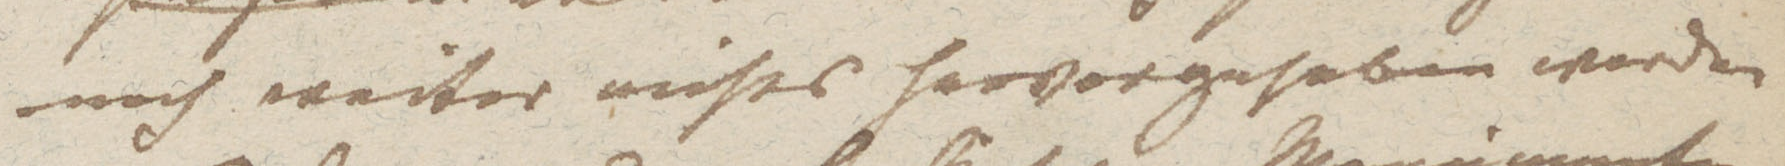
noch weiter nichts hervorgehoben werden
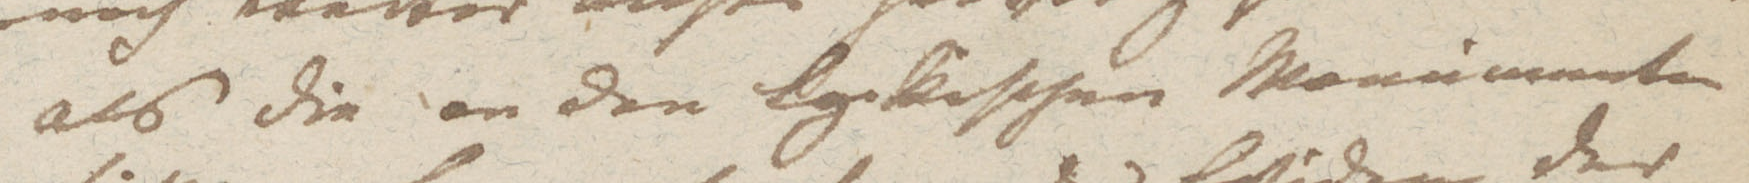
als die an den lykischen Monumenten
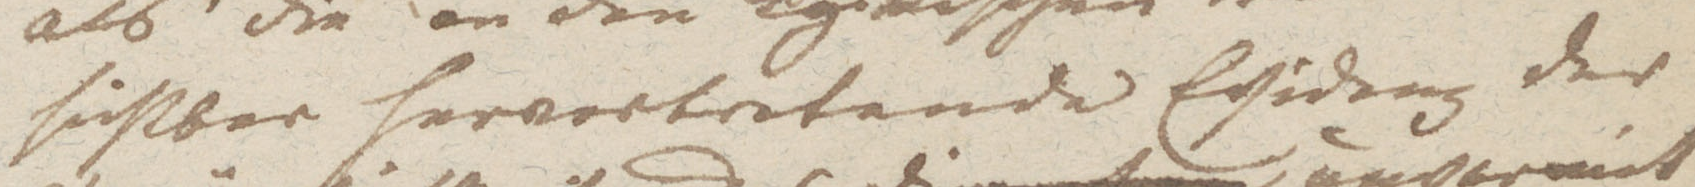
sichtbar hervortretende Evidenz der
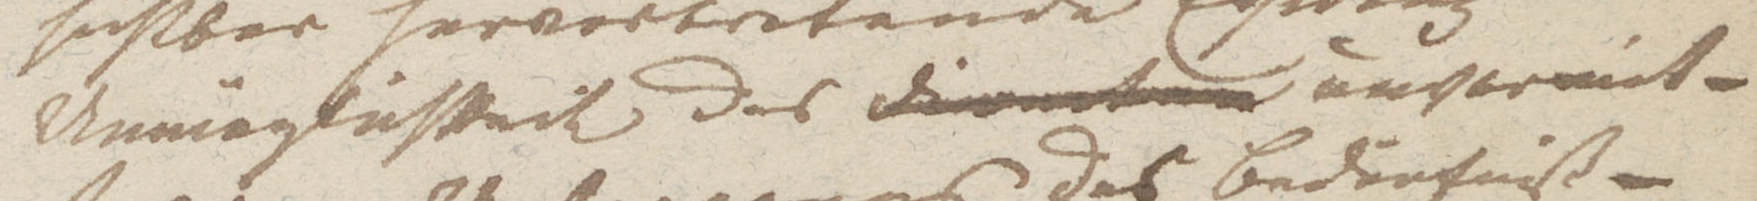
Unmöglichkeit des directen unvermit-
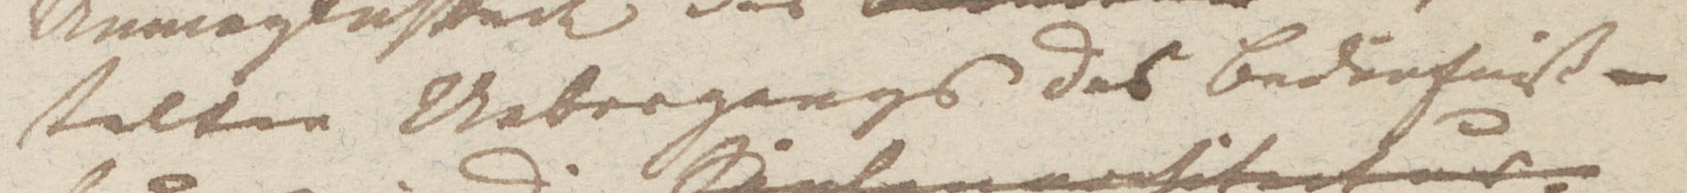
telten Uebergangs des Bedürfniss-
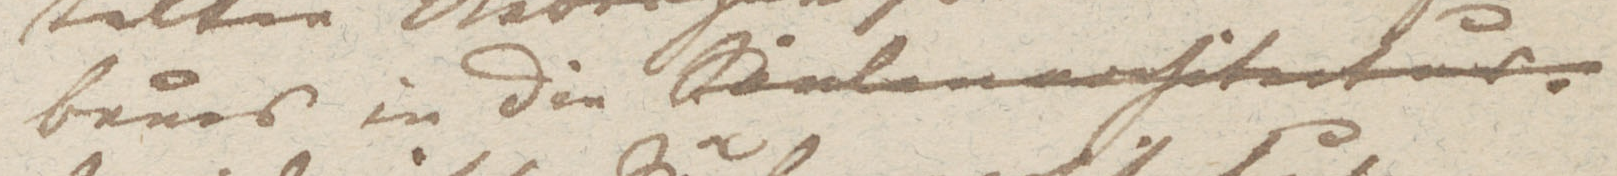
baues in die Säulenarchitectur.
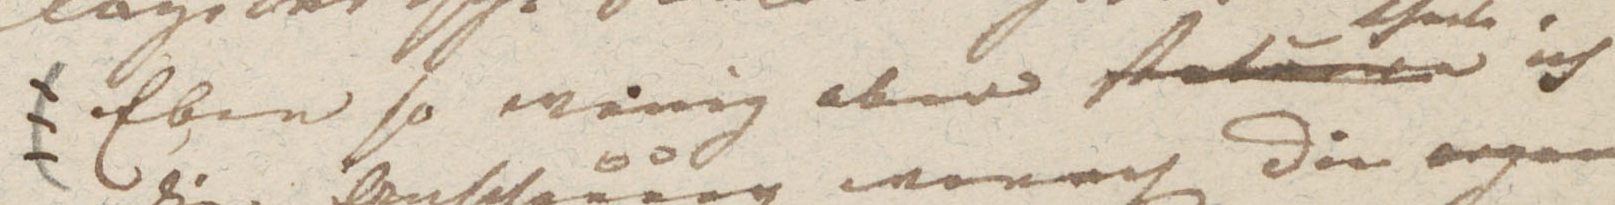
(Eben so wenig aber statuire theile ich
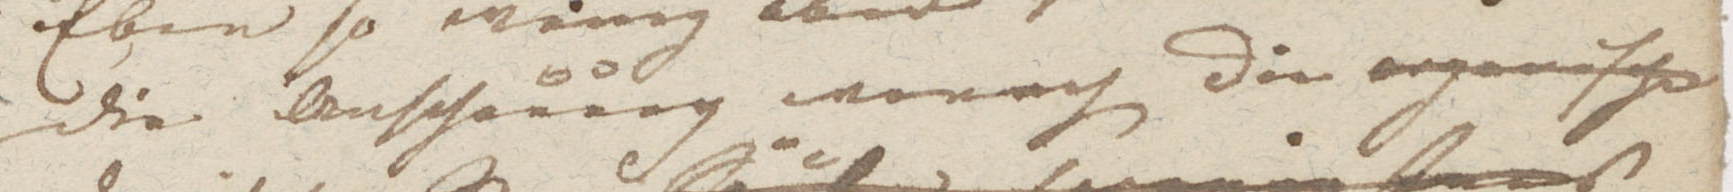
die Anschauung wonach die organische
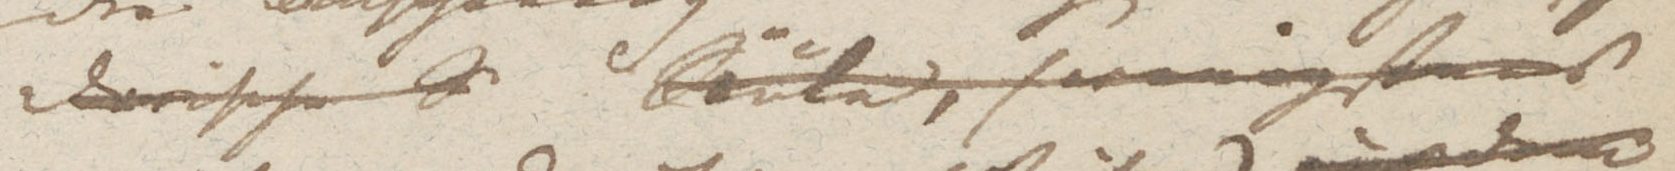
Dorische S Säule, (wenigstens
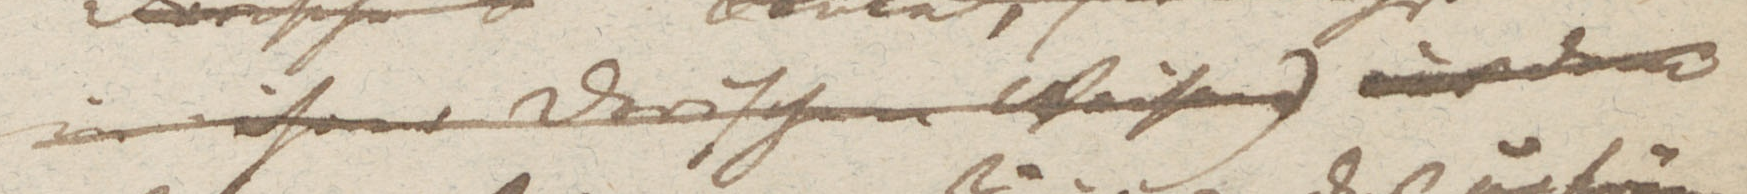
in ihrer Dorischen Weise) aus dem
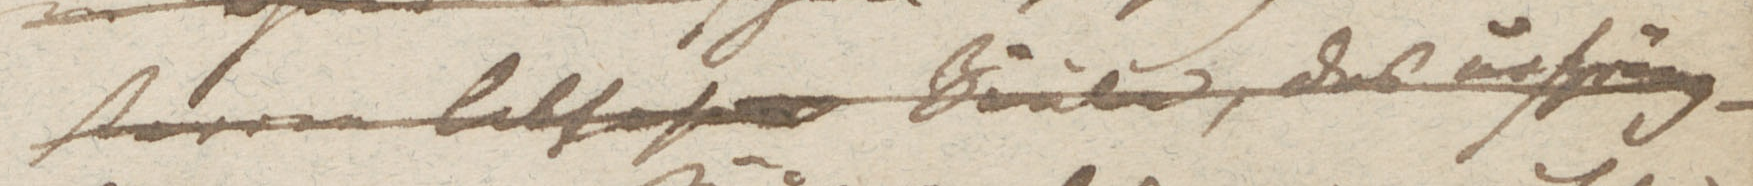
starren leblosen Säule, das ursprüng-
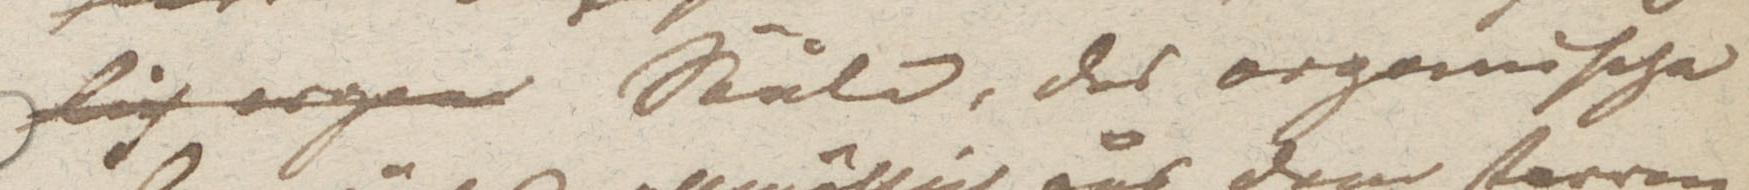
lich organ Säule, das organische
